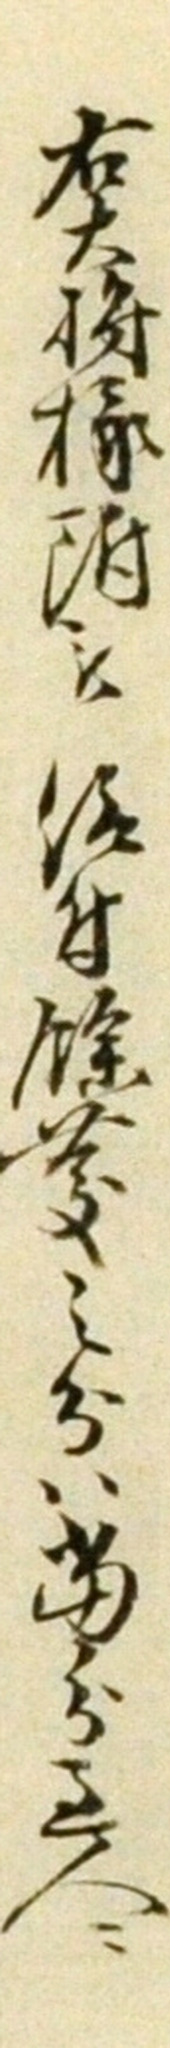右大将様附被仰付餘慶之分ハ当分過人ニ
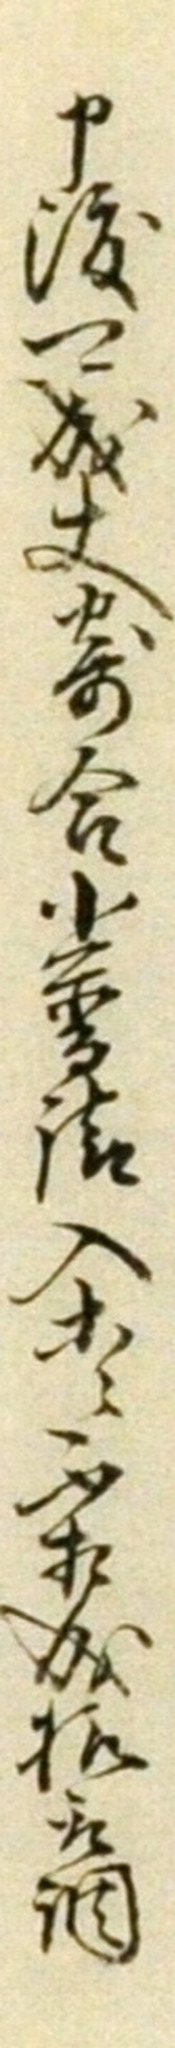申渡可成丈寄合小普請入等ニ不相成様取調
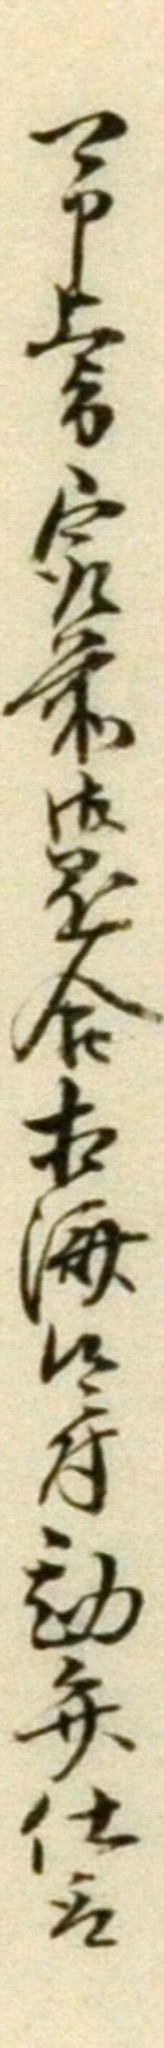可申上旨最前御懸合相済候ニ付勘弁仕取
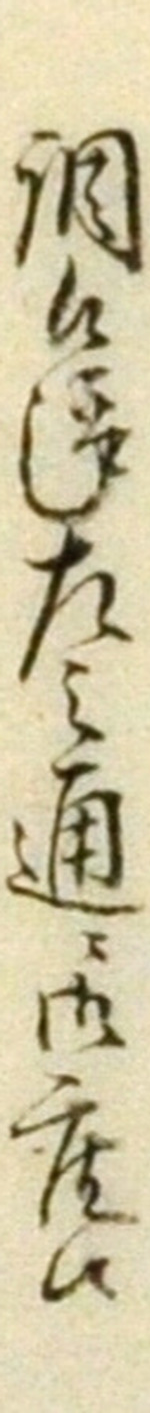調候趣左之通ニ御座候
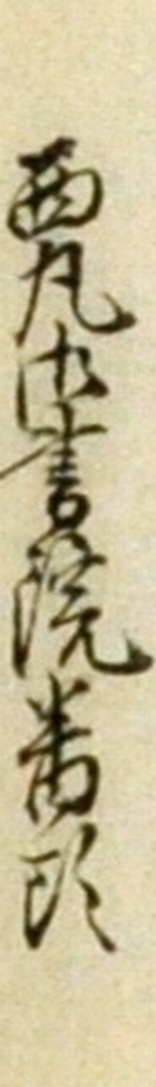西丸御書院番
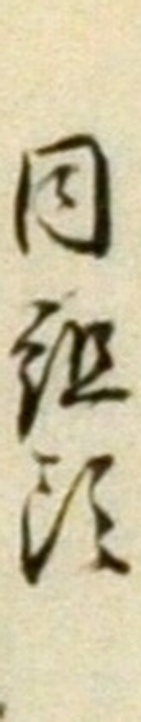同組頭
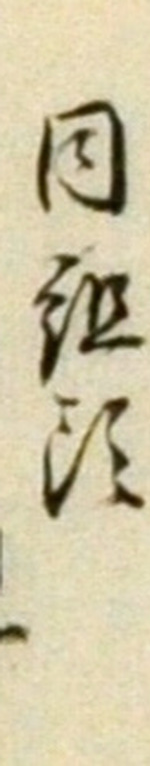同組頭
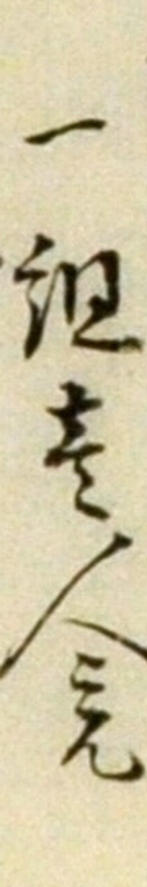一組壱人充
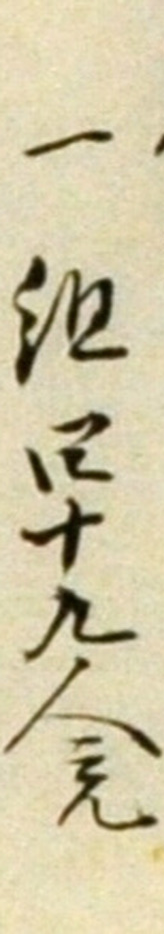一組四十九人充
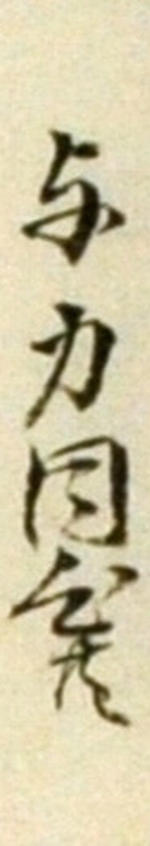与力同心共
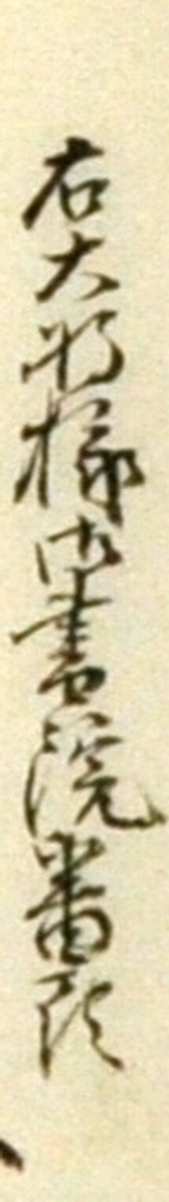右大将様御書院番頭

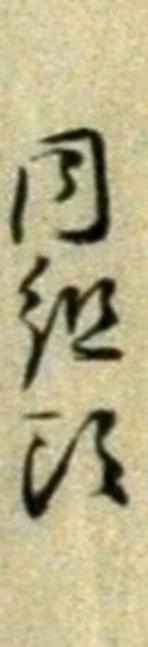同組頭
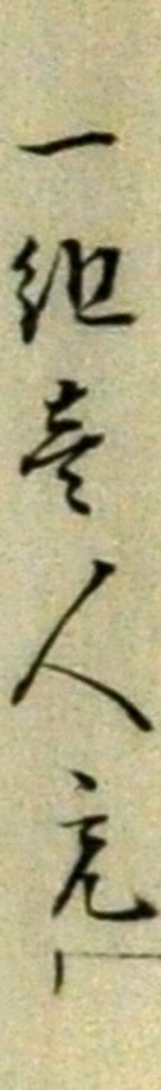一組壱人充
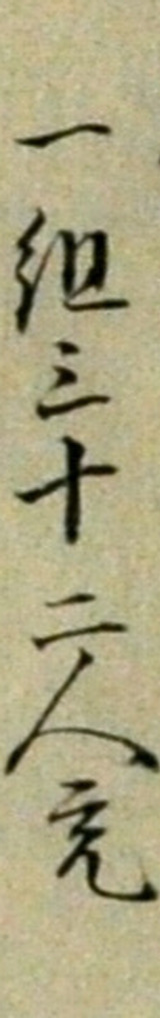一組三十二人充
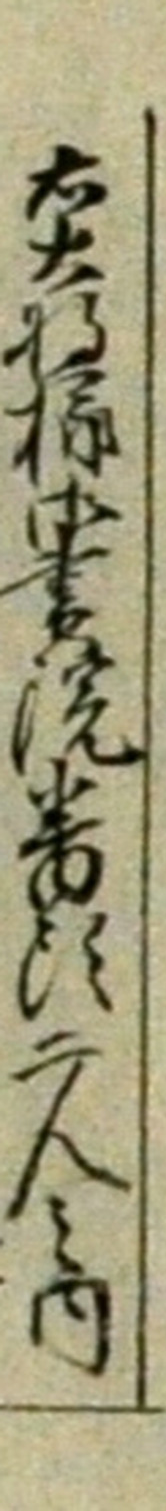右大将様御書院番頭二人之内
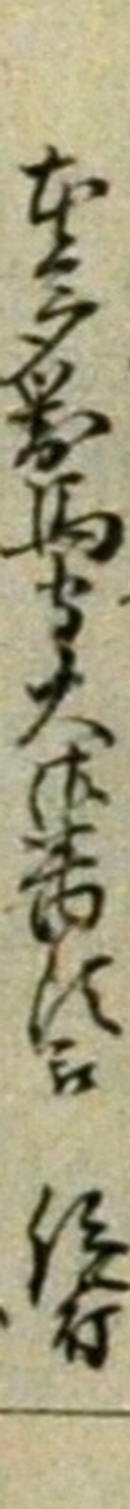本多對馬守大御番頭被仰付
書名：若年寄御役中御調書付
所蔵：伊那市立高遠町図書館・合同会社AMANE
